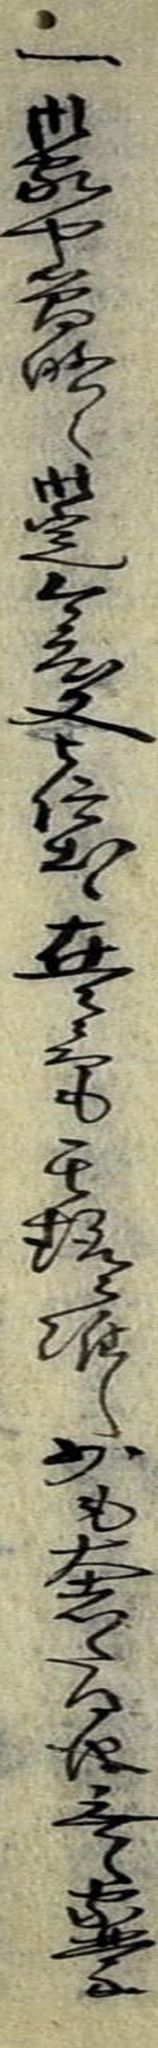一御家中簡略之御定今度又被仰出候在々ニ而も其趣ニ准し少も奢たる儀無之家業
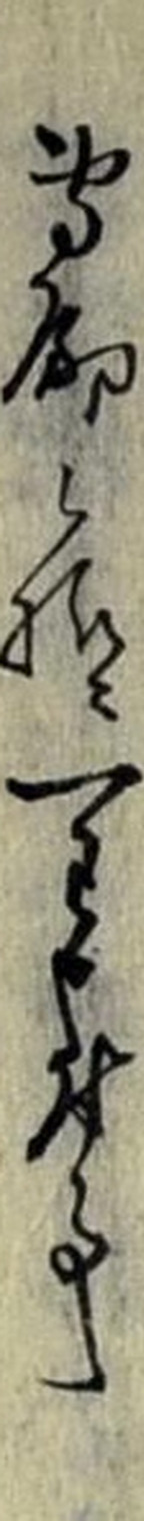専励候様ニ可被申付事
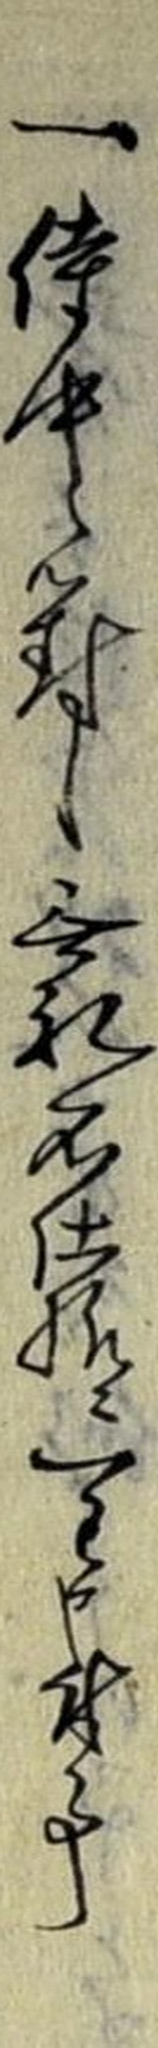一侍中へ対し無礼不仕様ニ可被申付事
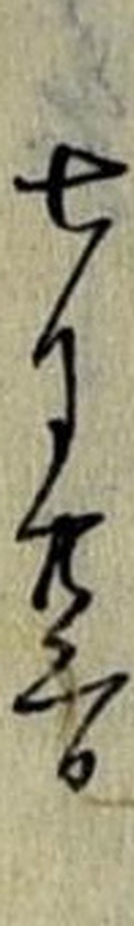七月廿二日
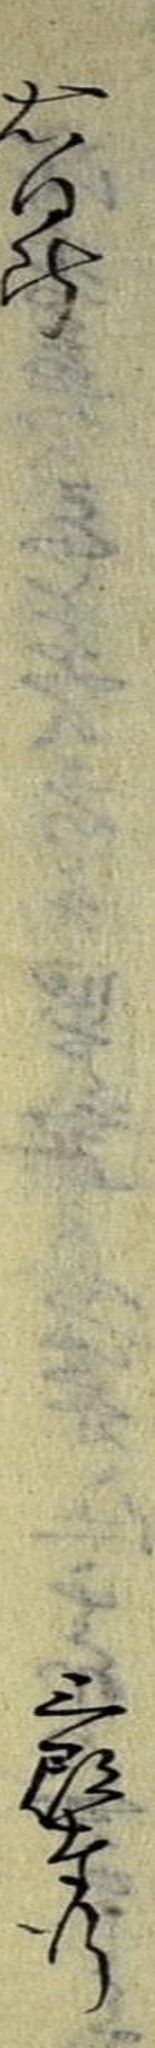右同断三郡奉行
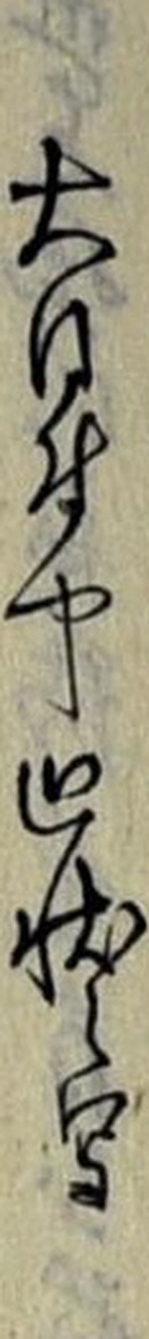大目付中廻状之写
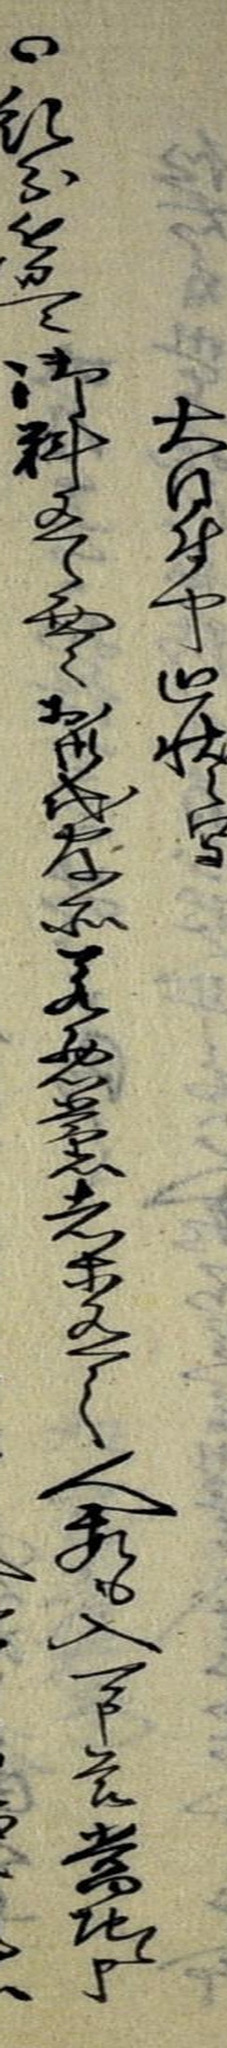〇領分近辺ニ御料有之面々於御代官所若悪党者等有之人数も入可申節当地へ申
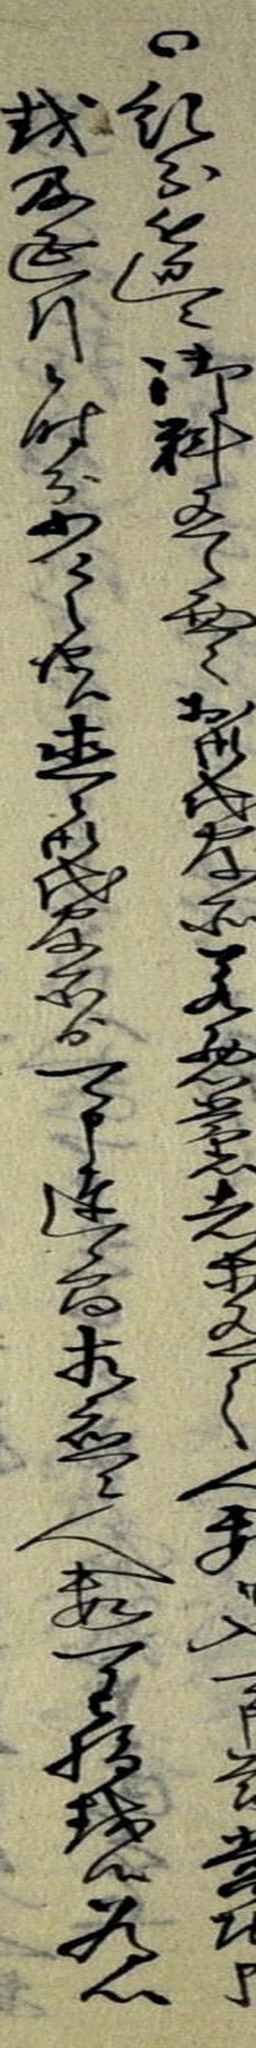越及延引候時分少々之儀ハ直々御代官所ゟ可申達候間相応ニ人数可被指越候為心
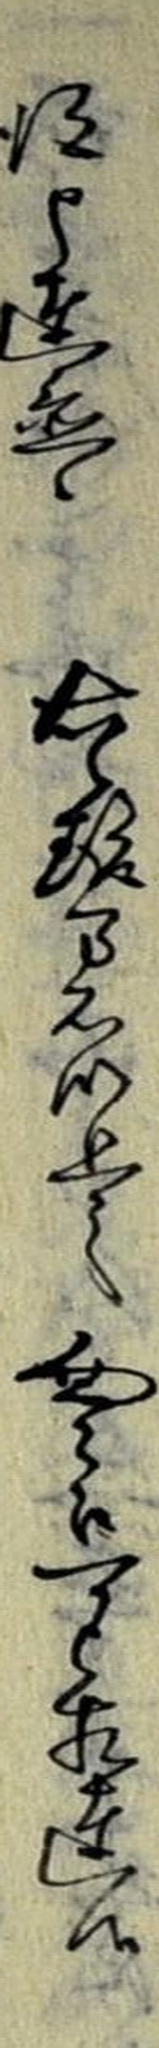得申達置候右之趣万石以上之面々江可被相達候
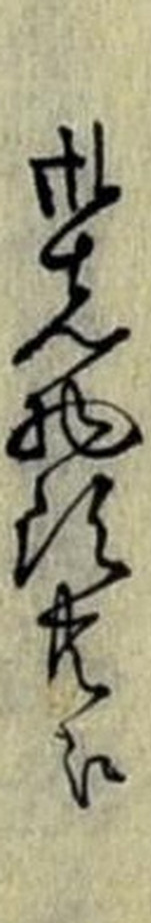御先物頭共江
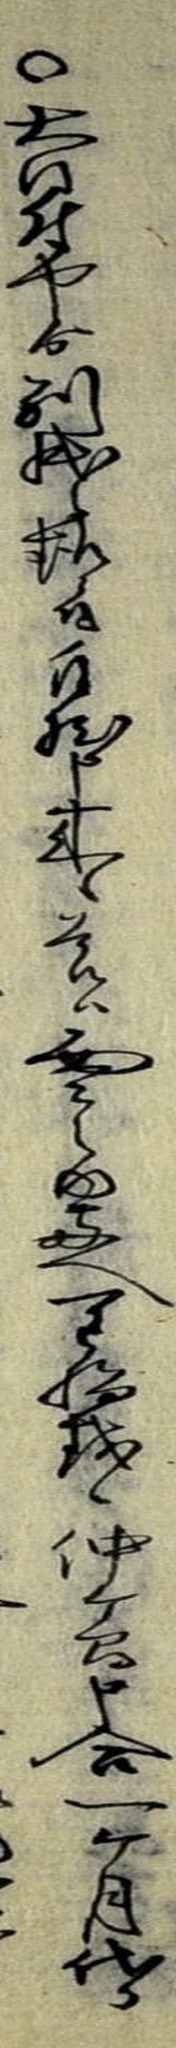〇大目付中ゟ別紙之趣ニ付自然申来候節ハ面々之内両人可被指越候仲ケ間申合一ケ月代り
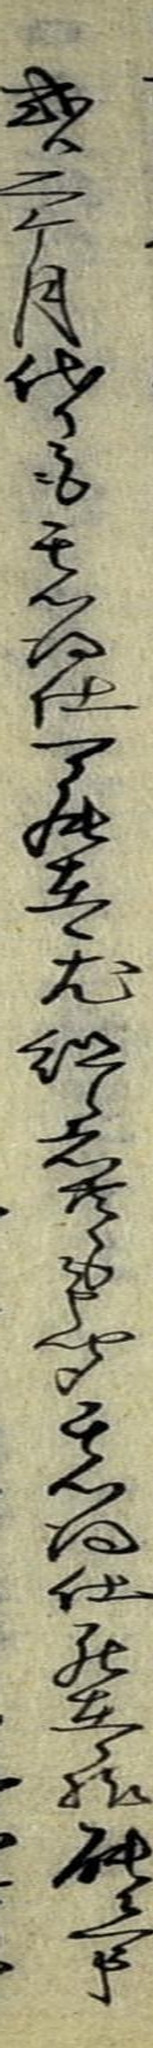或ハ二ケ月代りニも其心得仕可罷在候尤組之者共へも申聞其心得仕罷在候様能々可申
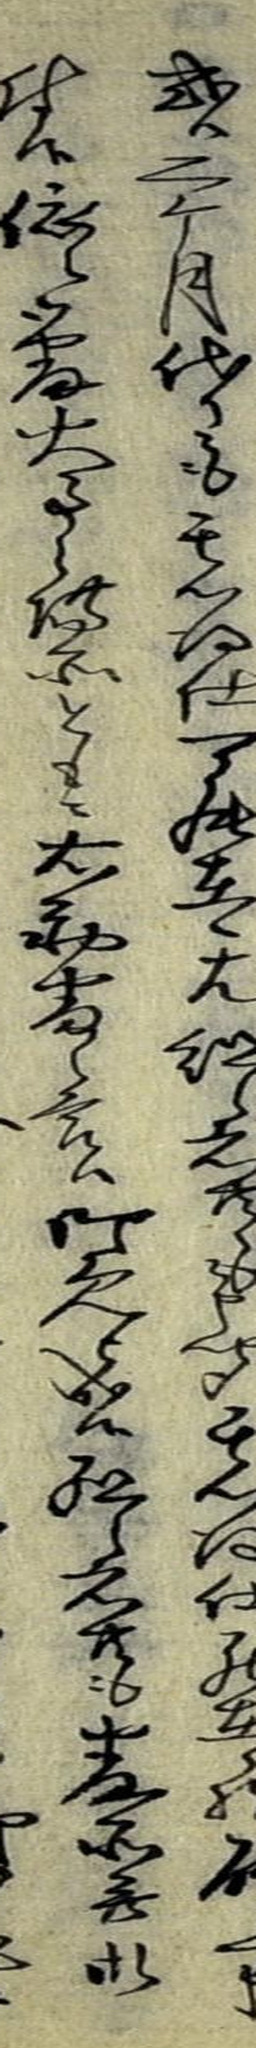付候依之御番火事之場所ともニ右勤番之節ハ御免被成候組之者共も番所并御
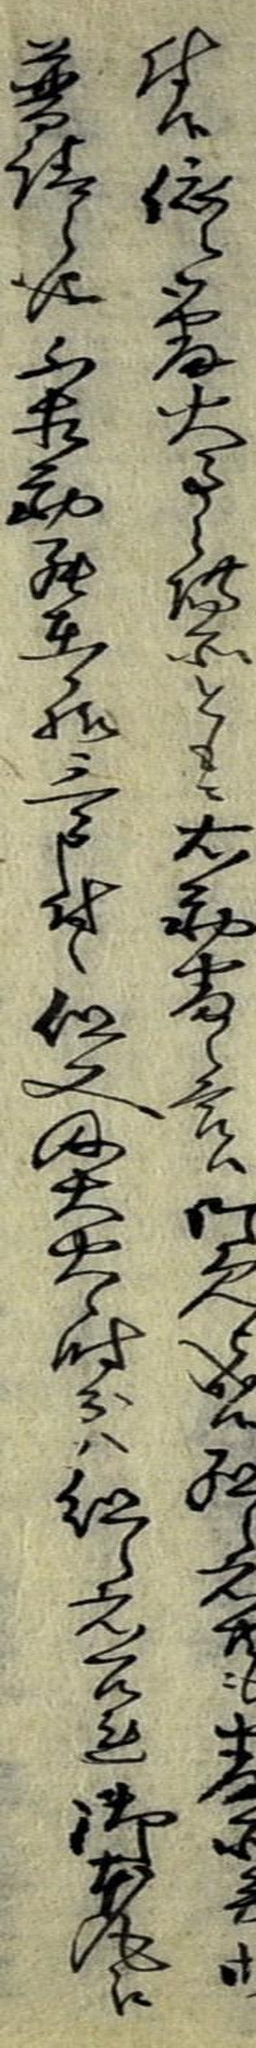普請之儀不相勤罷在候様ニ可申付候但又及大火候時分ハ組之者召連御本丸江
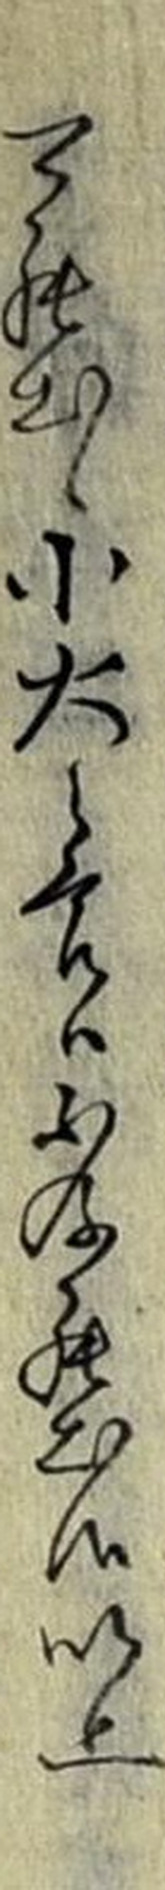可罷出候小火之節ハ不及罷出候以上
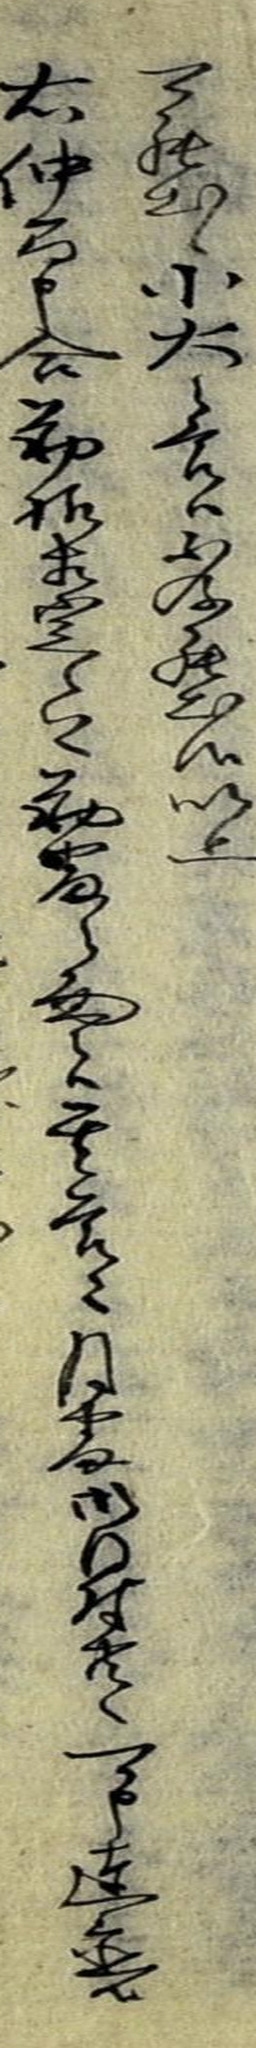右仲間申合勤様相定候ハヽ勤番之面々ハ其節々月番御目付共へ可申達置候
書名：命令之部 一
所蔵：福井県文書館 Fukui Prefectural Archives
